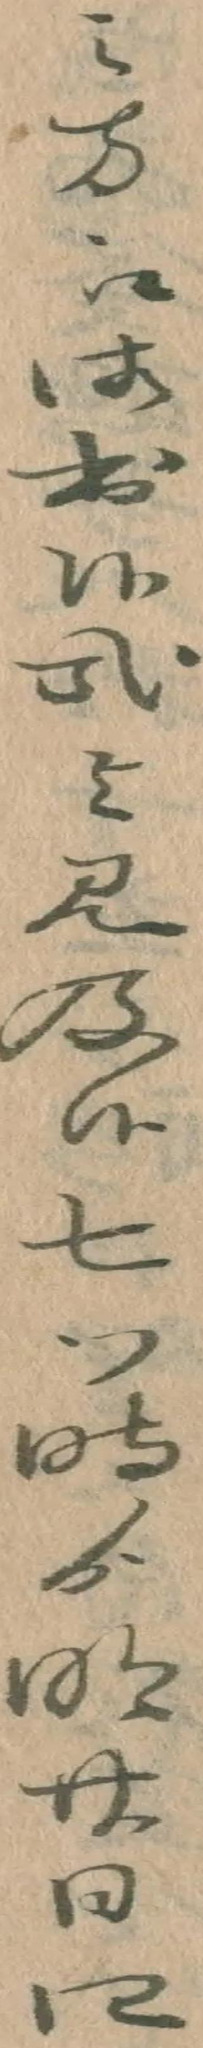之方江御出候哉与見及候七つ時ゟ明廿日四
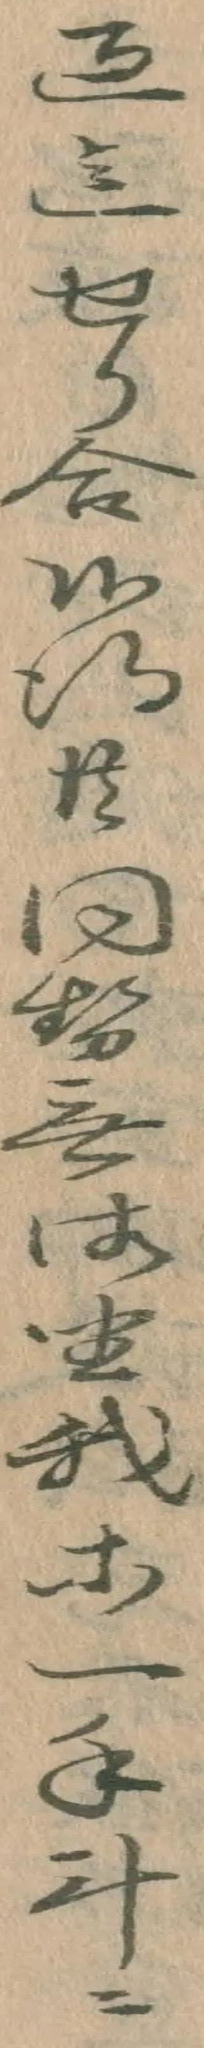過迄せり合候得共同勢無御坐我等一手斗に
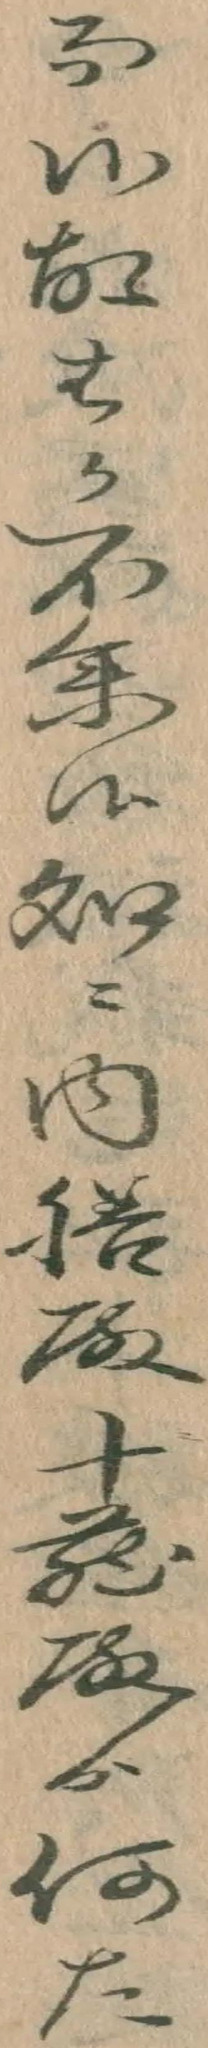而候故者か不参候処に内膳殿十蔵殿ゟ何た
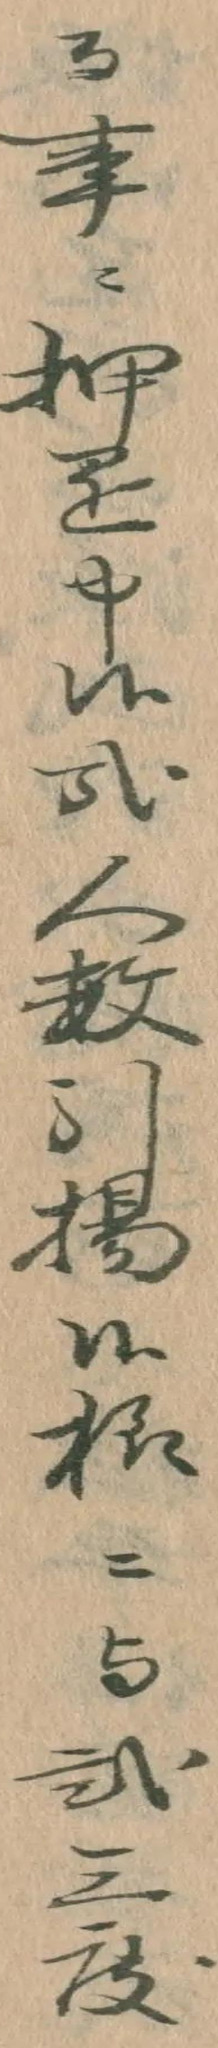る事に押懸申候哉人数引揚候様に与弐三度
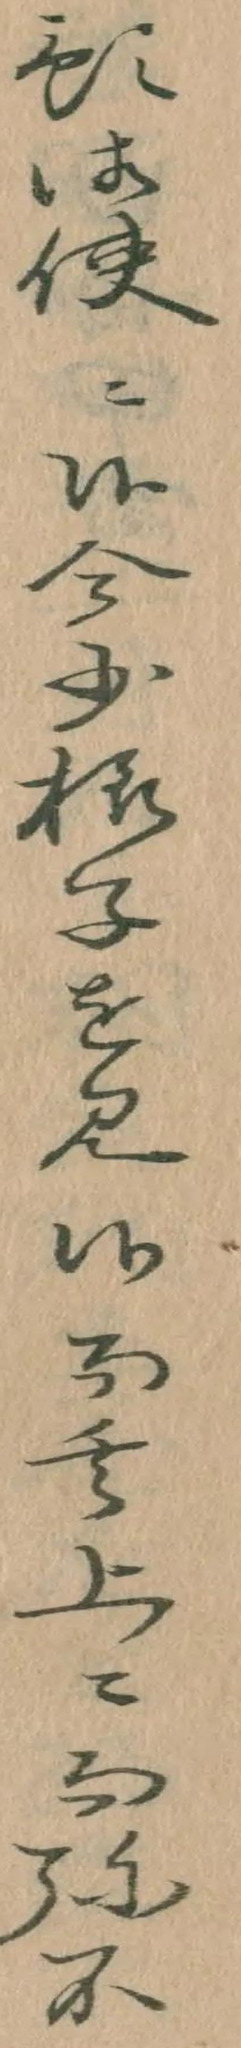預御使に候今少様子を見候而其上に而弥不
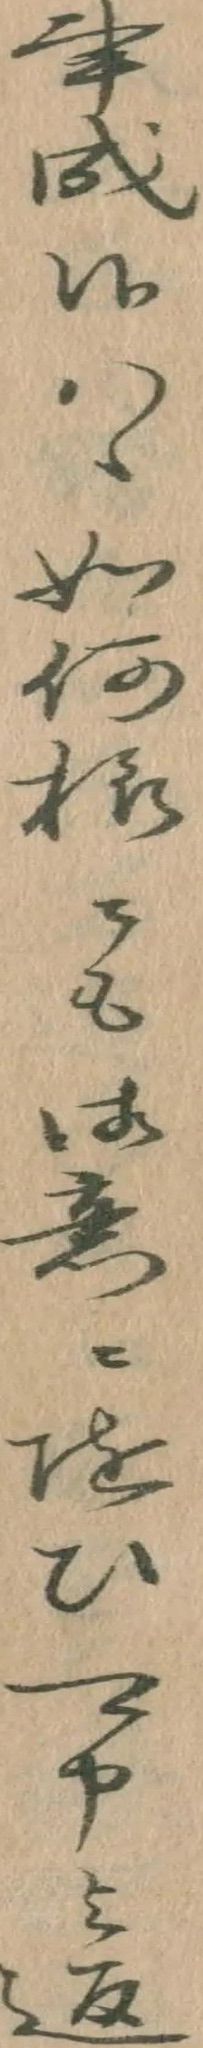書成候はゝ如何様にも御意に随ひ可申与返
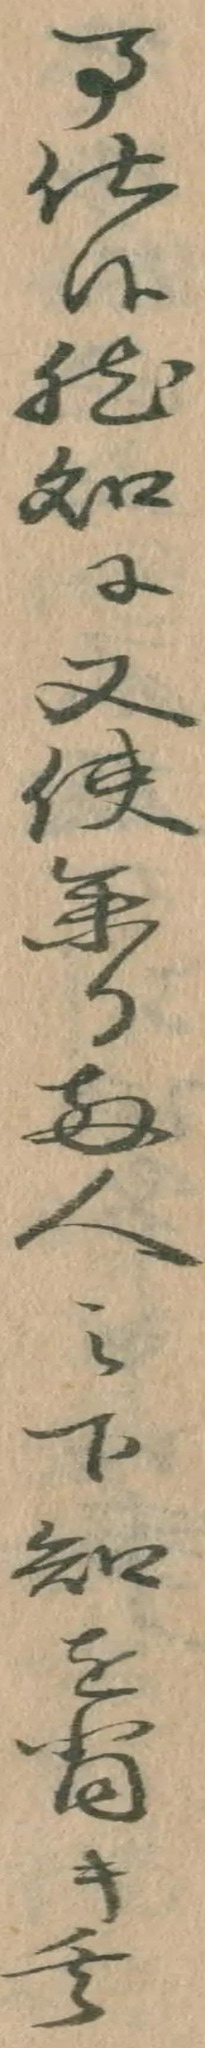事仕候然処尓又使参り両人之下知を背き其
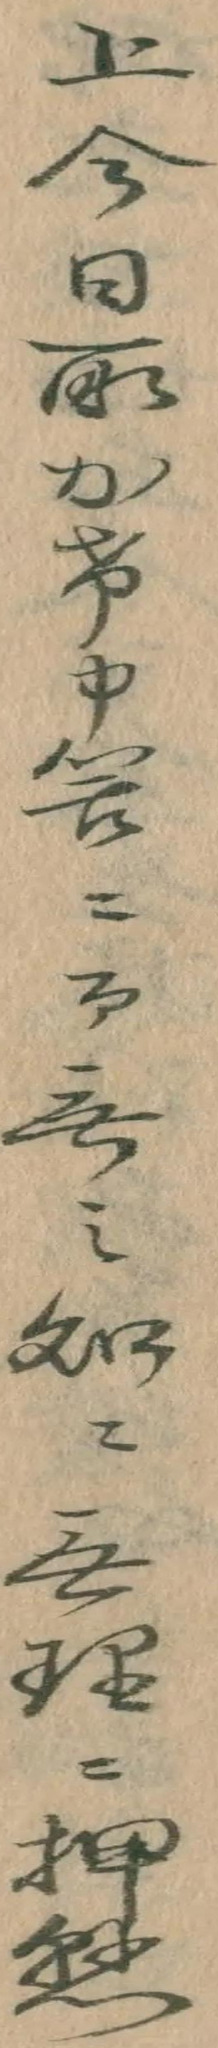上今日取か希申筈に而無之処に無理に押懸
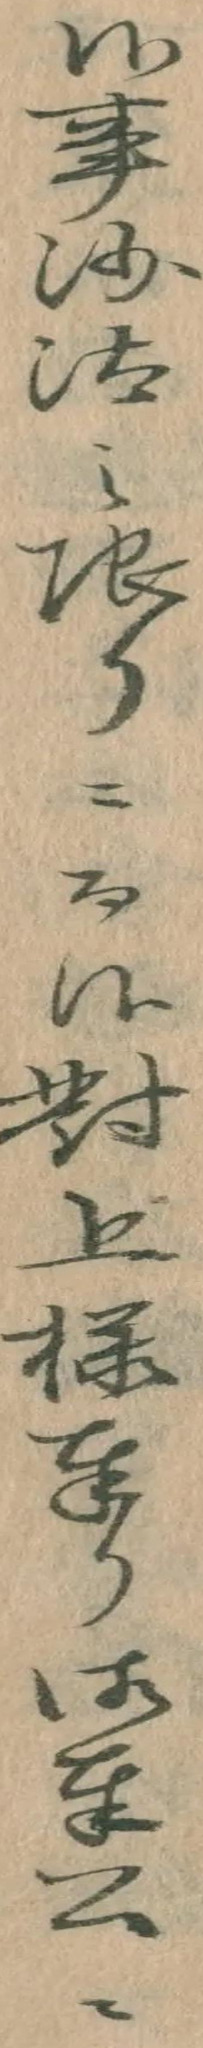候事沙汰之限りに而候対上様奉り御奉公に
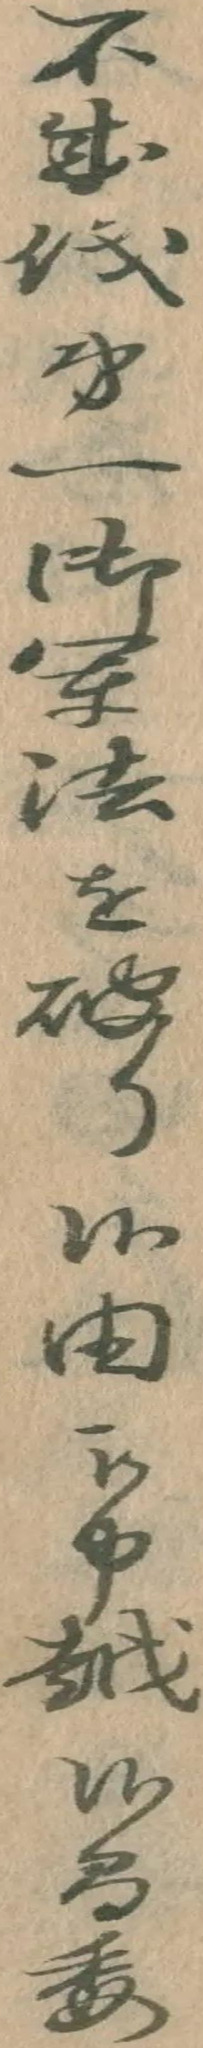不成儀第一御軍法を破り候由被申越候間委
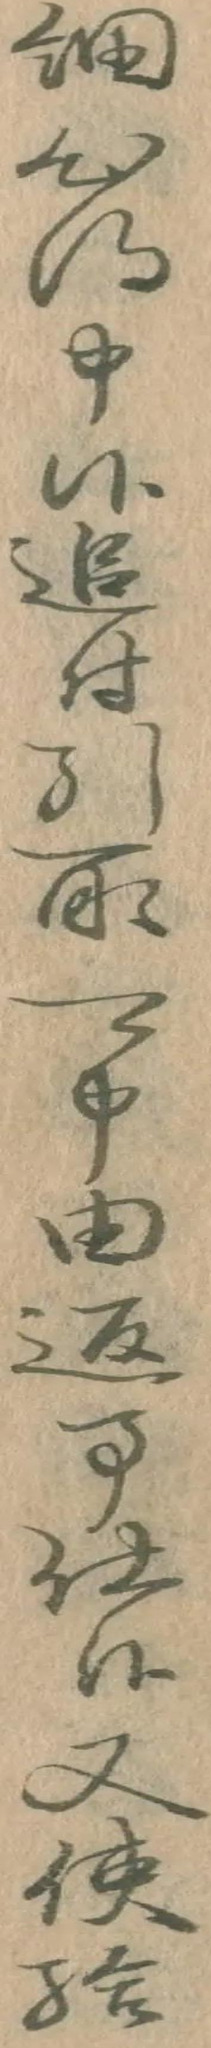細心得申候追付引取可申由返事仕候又使給
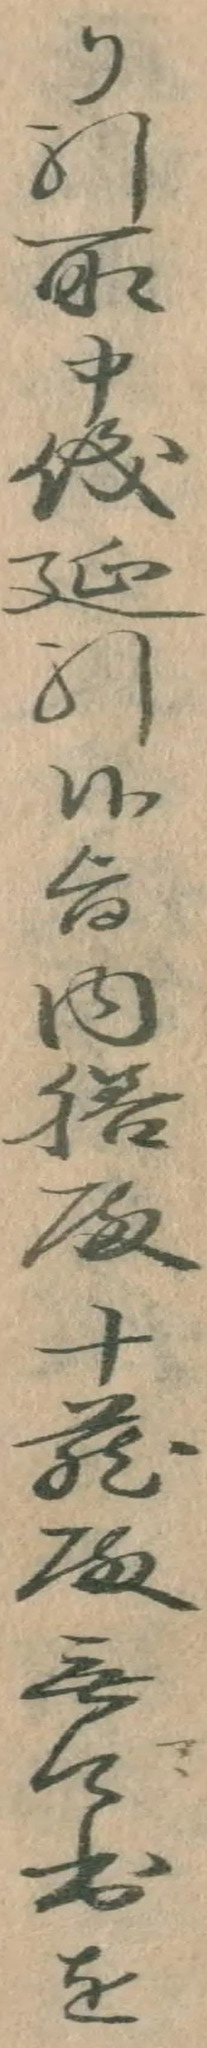り引取申儀延引候旨内膳殿十蔵殿無之出を
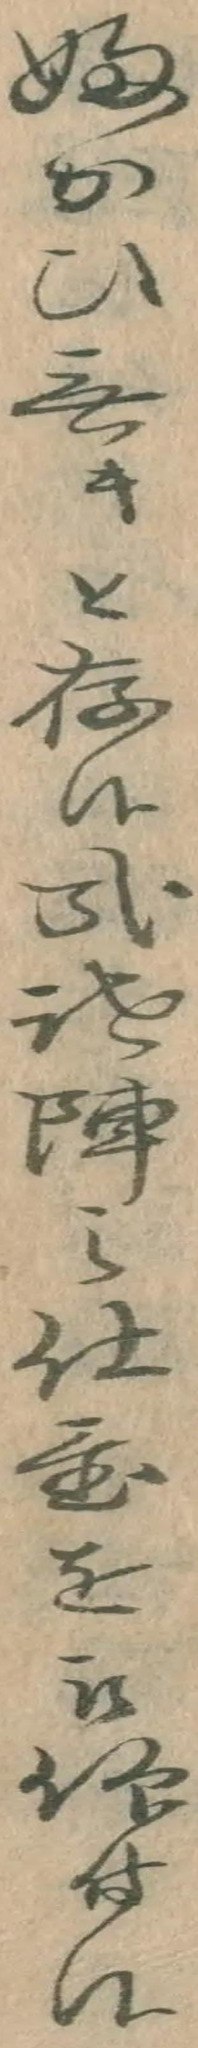婦かひ無きと存候哉諸陣之仕置を被仰付候
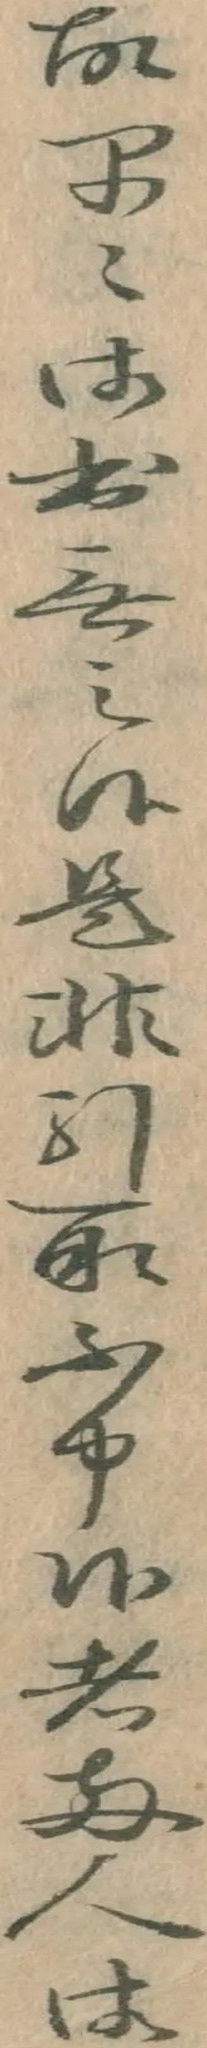故早々御出無之候是非引取ふ申候者両人御

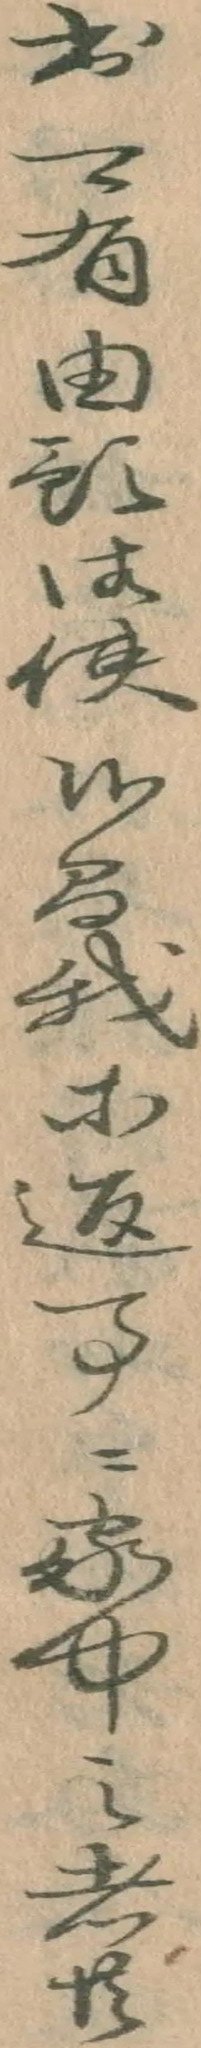出可有由預御使候間我等返事に家中之者共
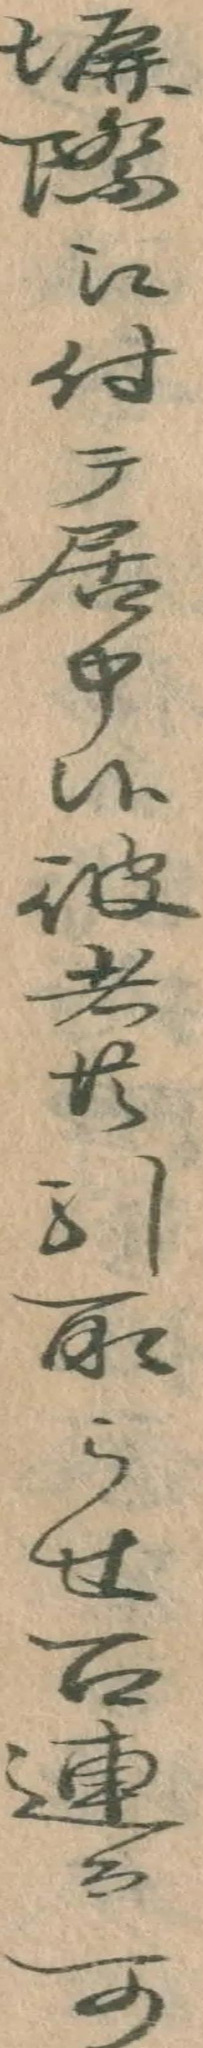塀際江付て居申候彼者共引取らせ召連而可
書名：切支丹御退治記 49巻. [4]
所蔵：国立国会図書館 National Diet Library, JAPAN
